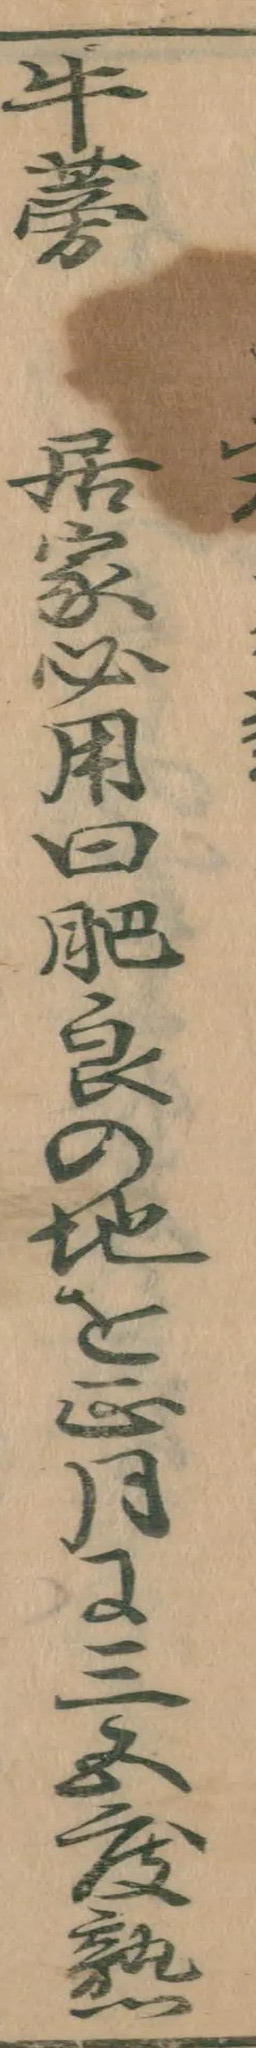牛蒡居家必用日肥良の地を正月に三五度熟
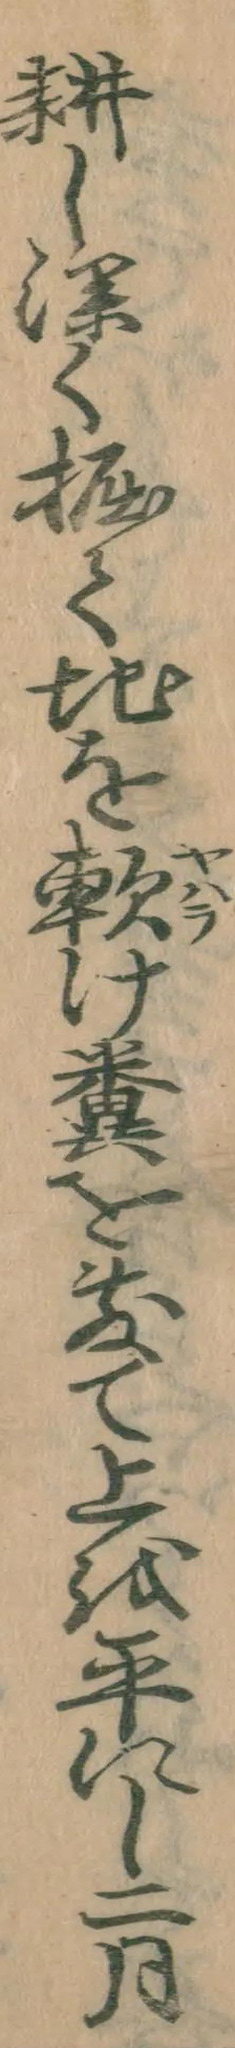耕し深く掘て地を軟け糞を敷て上を平にし二月
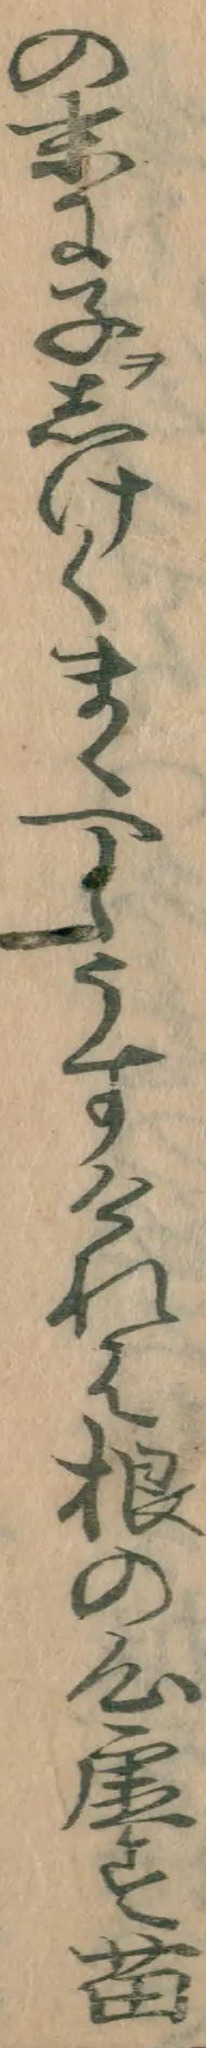の末に子しけくまくへしうすけれは根の心虚す苗
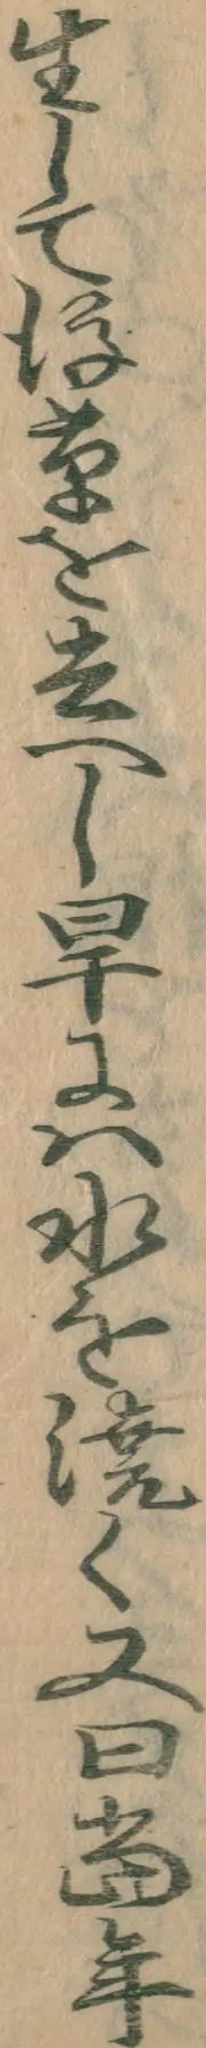生して後草を去へし旱には水を澆く又曰当年
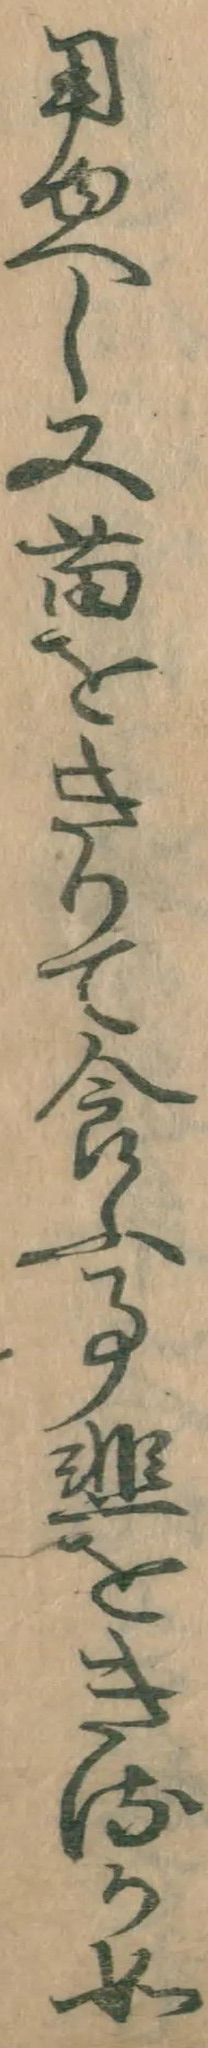用ゆへし又苗をきりて食ふる韮をきるか如
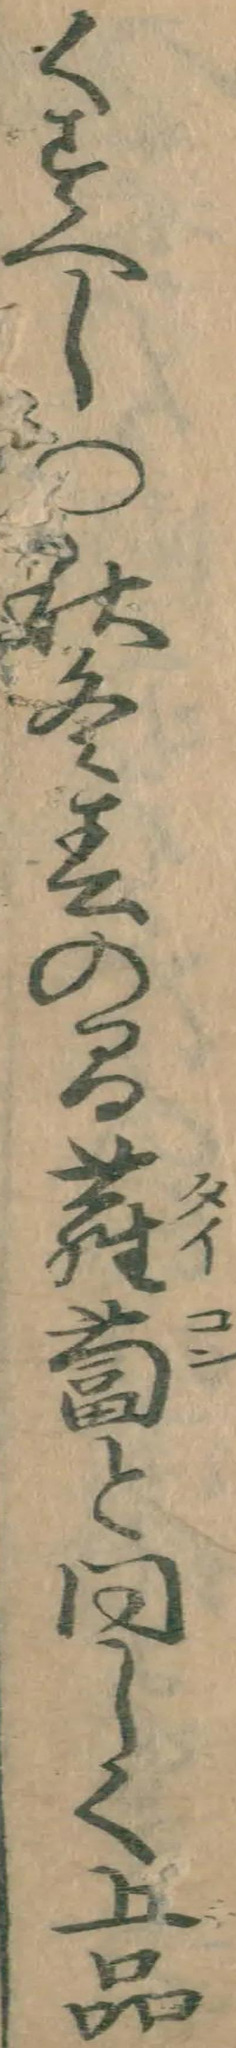くすへし◦〇秋冬春の間蘿蔔と同しく上品

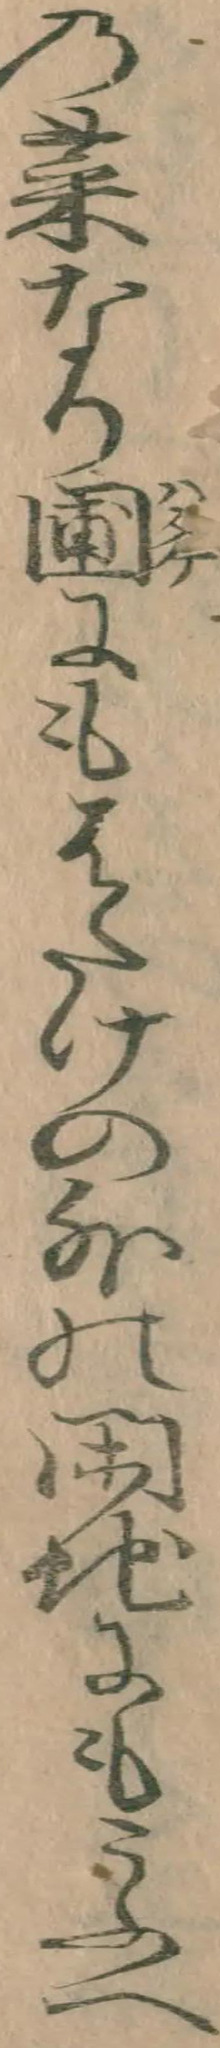の菜なり圃にもはたけの外の閑地にもうふへ
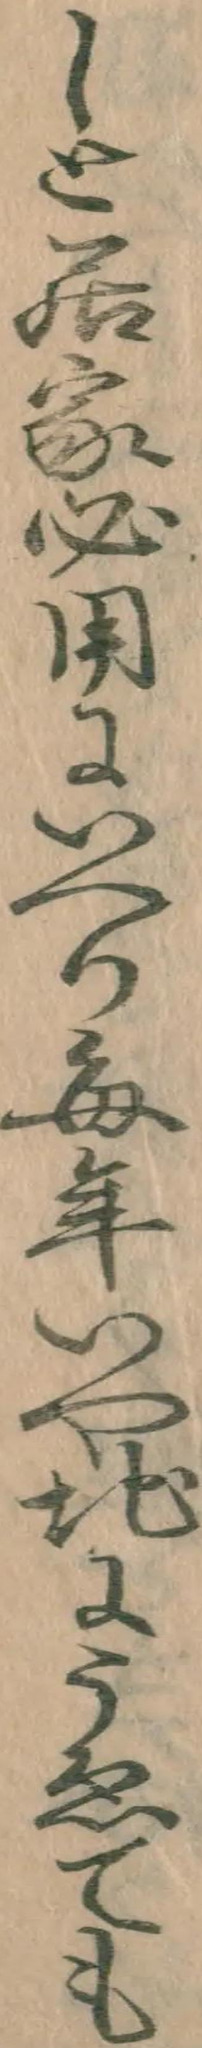しと居家必用にいへり毎年いや地にうゑても
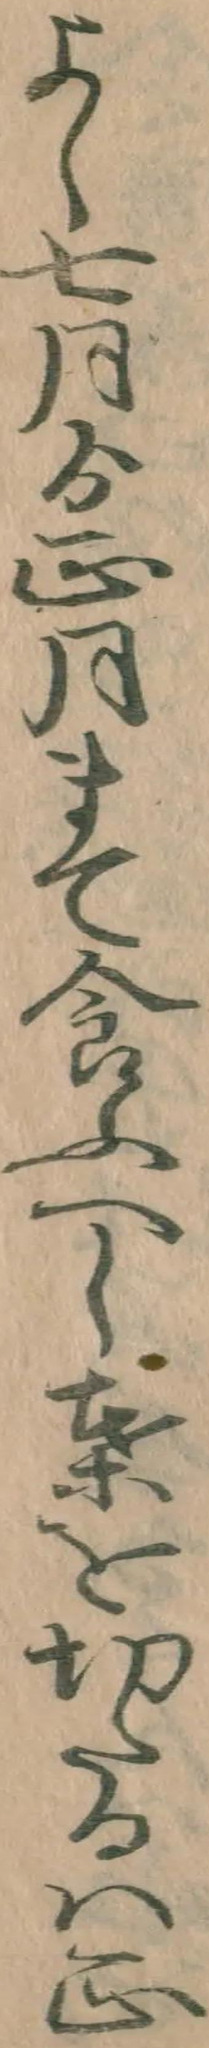よし七月ゟ正月まて食ふへし葉を切たるは正
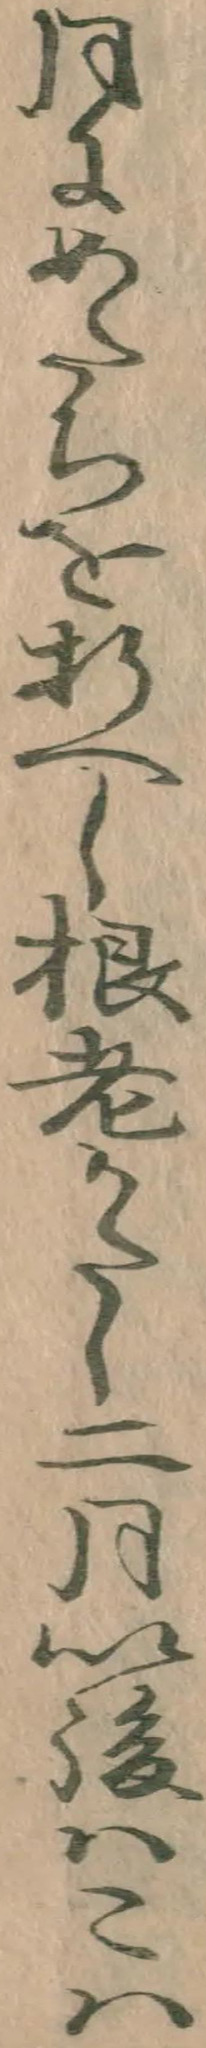月にめたちを折へし根老かたし二月以後はこは
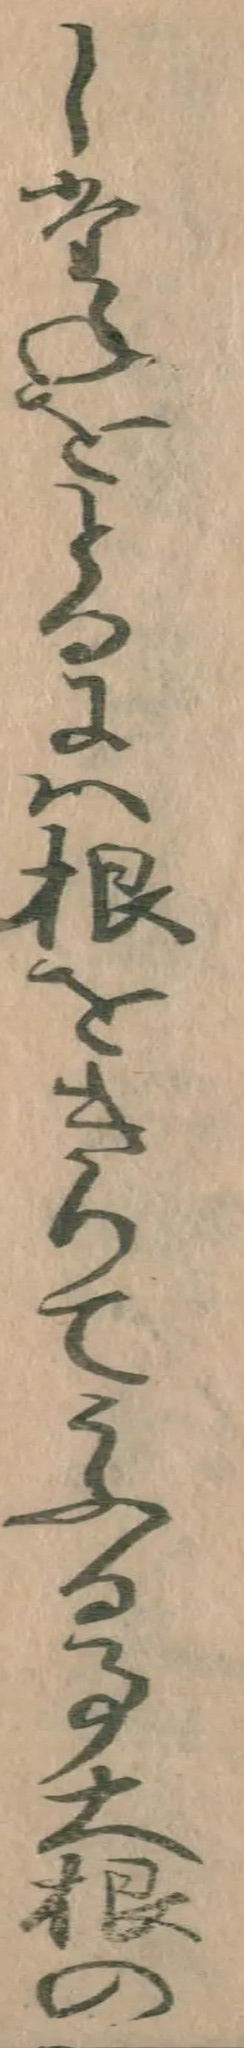したねをとるには根をきりてうふる事大根の
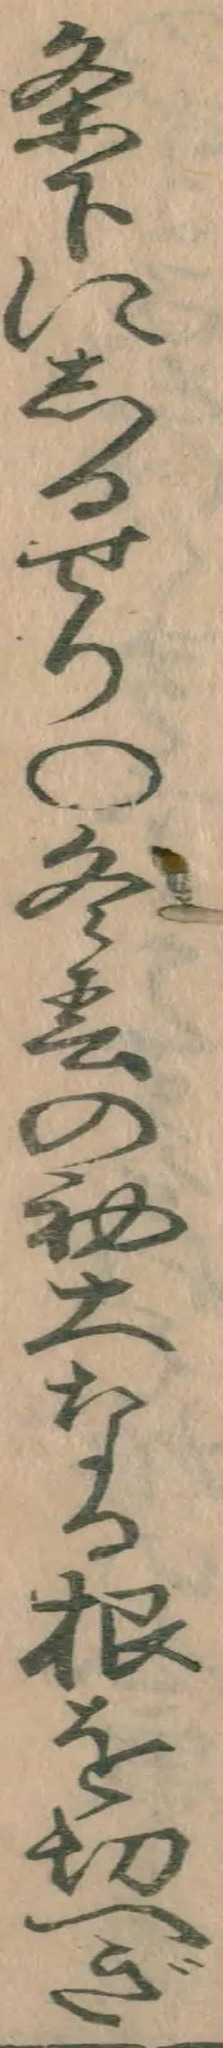条下にしるせり〇冬春の初大なる根を切へぎ
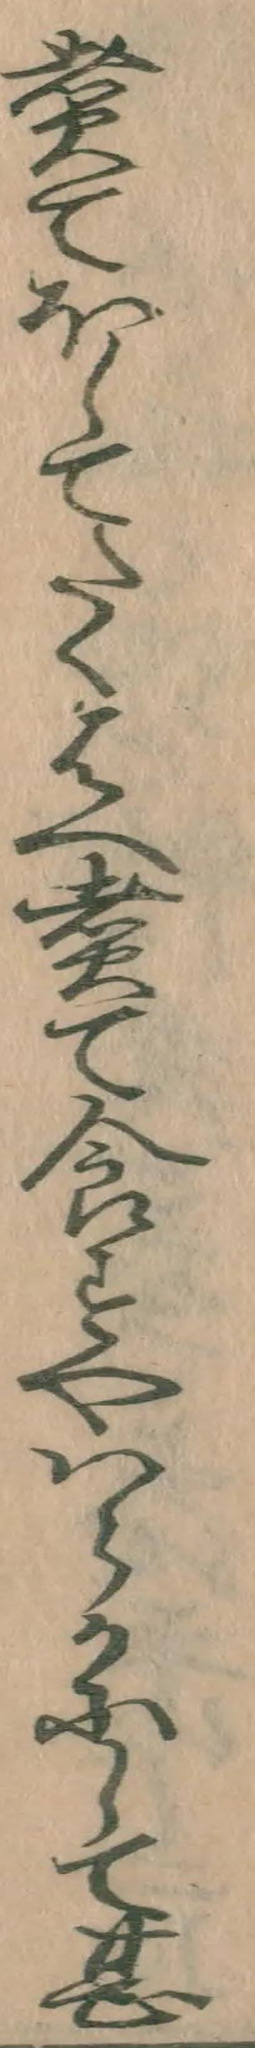煮てほしてたくはへ煮て食すやはらかにして甚
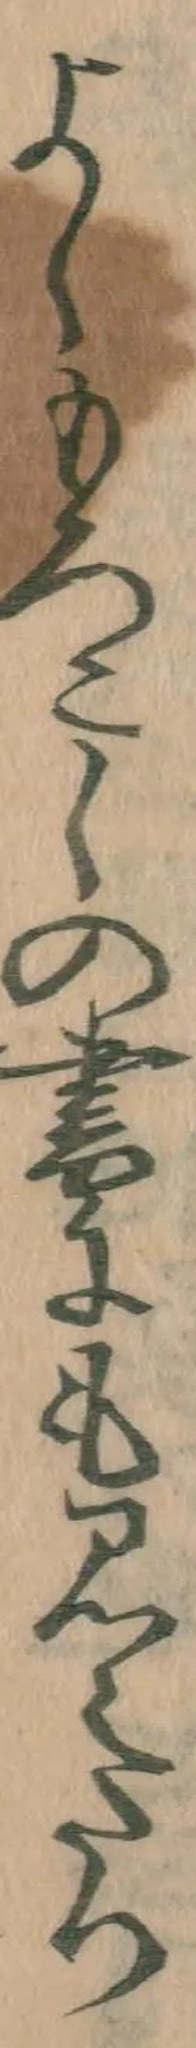よしもろこしの書にも見えたり
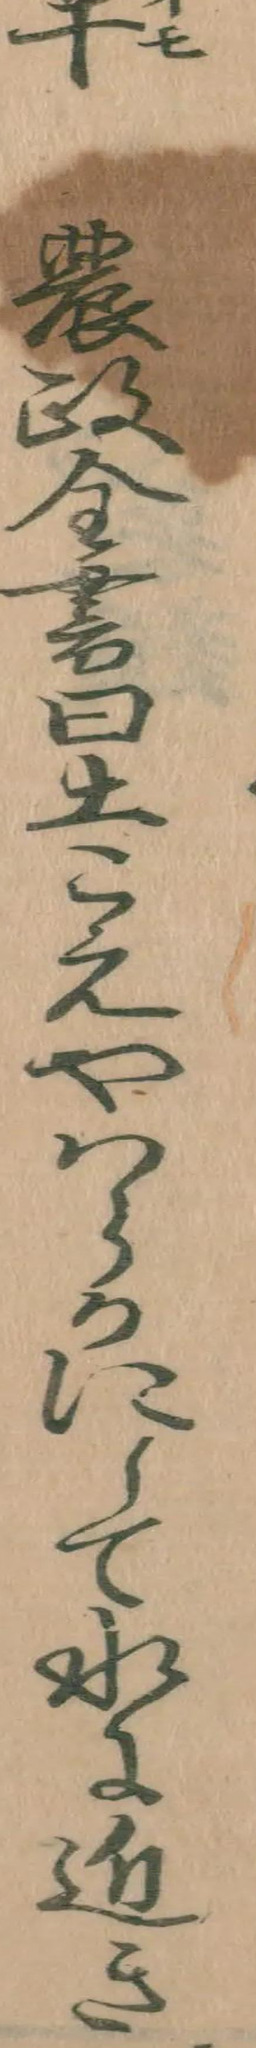芋農政全書曰土こえやはらかにして水に近き
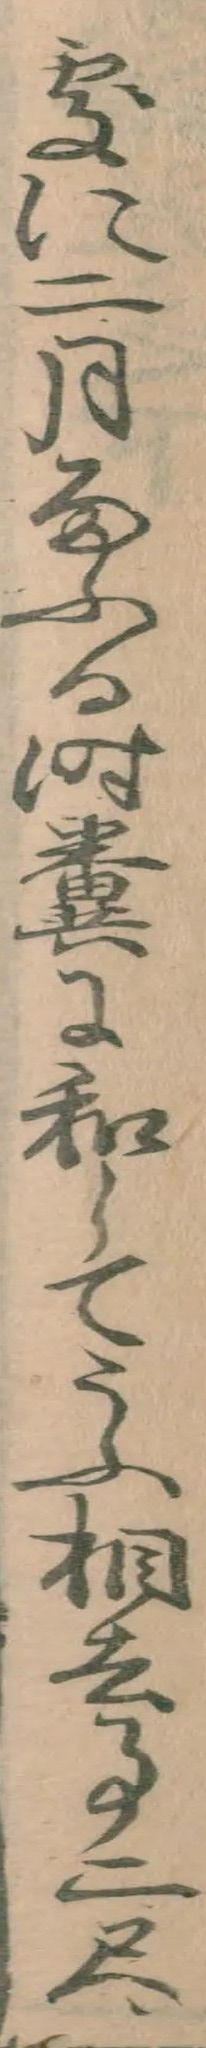処に二月雨ふる時糞に和してうふ相去事二尺
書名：菜譜 3巻
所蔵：国立国会図書館 National Diet Library, JAPAN
